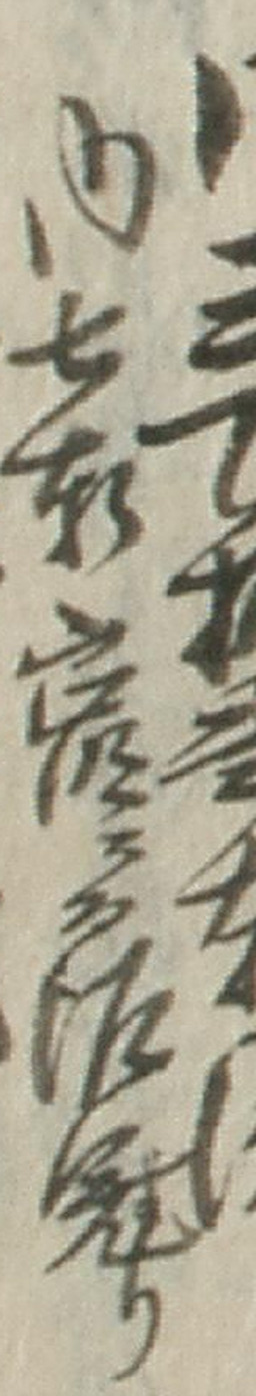内七軒山崩二而泥冠り
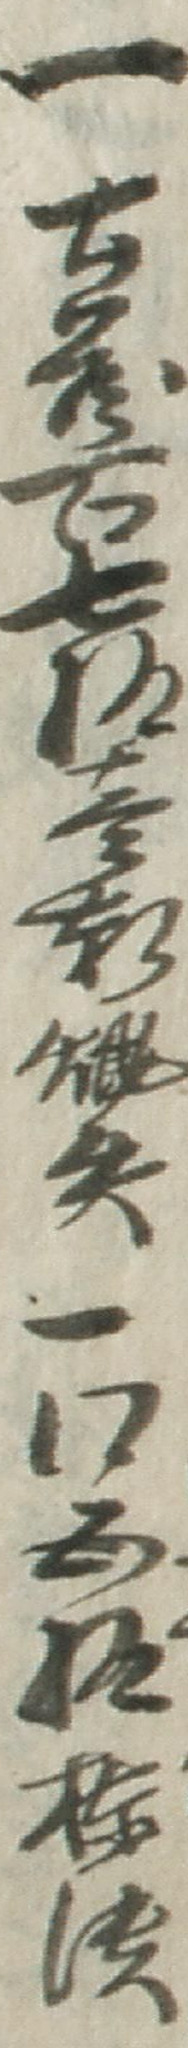一土蔵百七拾壱軒焼失一同五拾棟潰
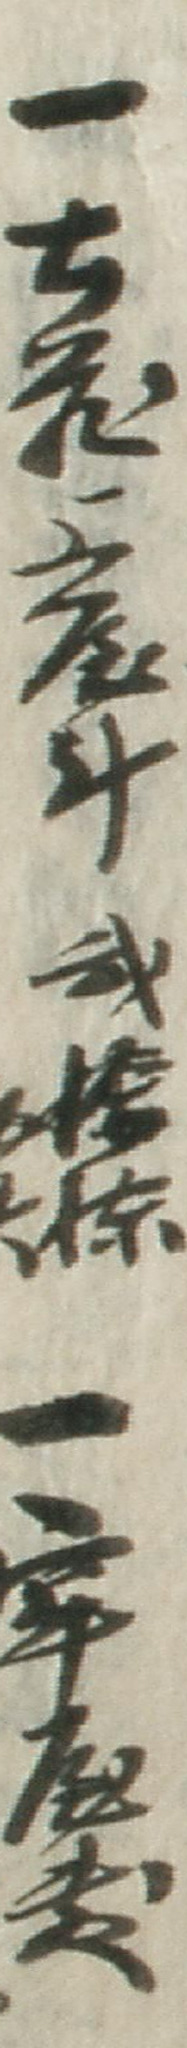一土蔵上屋計弐拾棟一牢屋敷
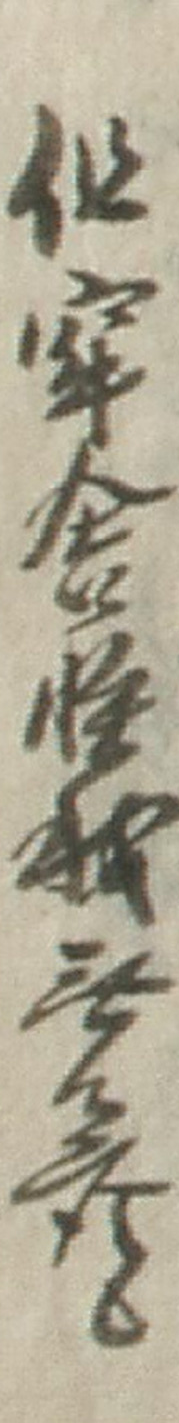但牢舎怪我無御座候

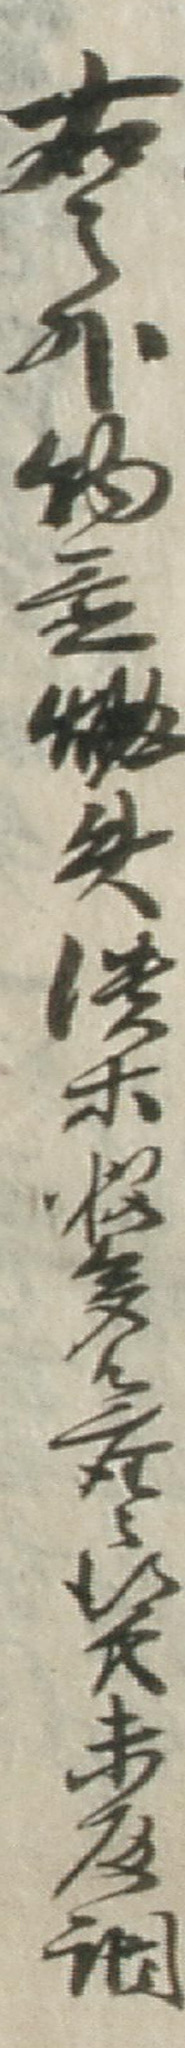右之外物置焼失潰等数多御座候得共未取調
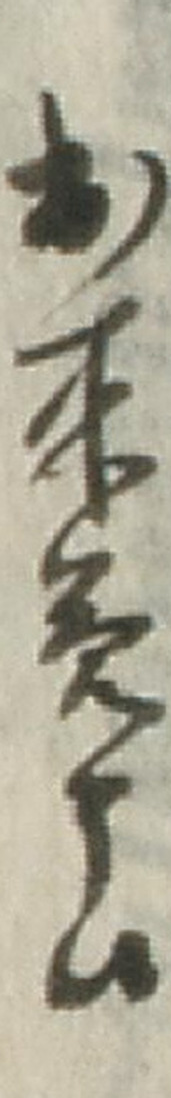出来兼申候
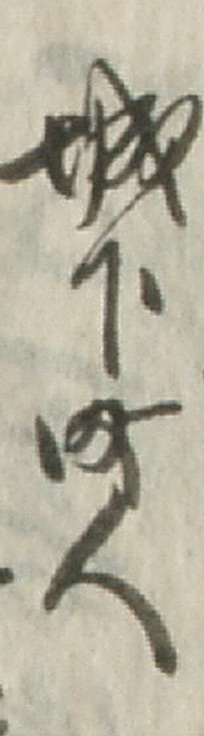城下町人
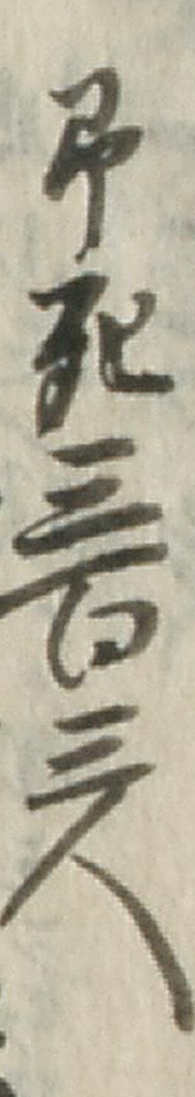即死三百三人
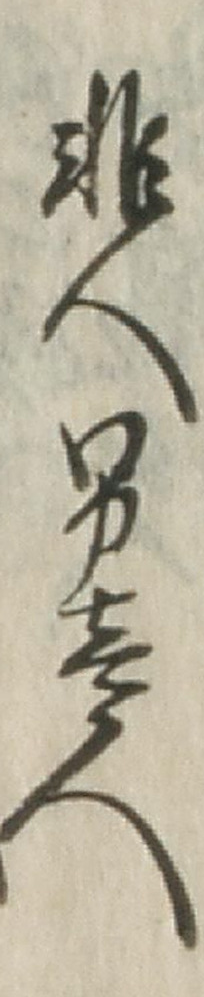非人男壱人
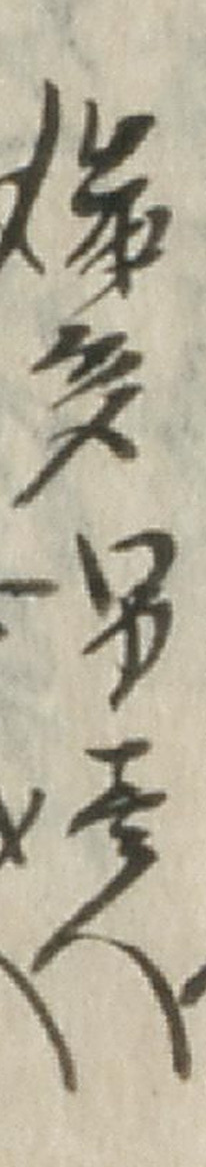穢多男壱人
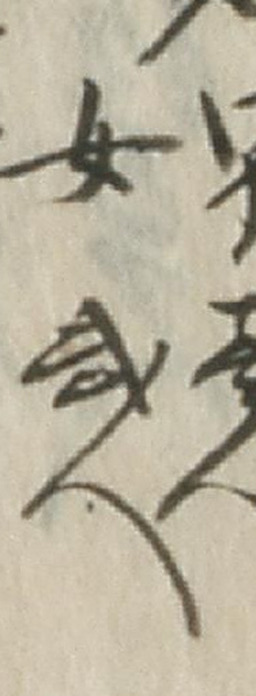女弐人
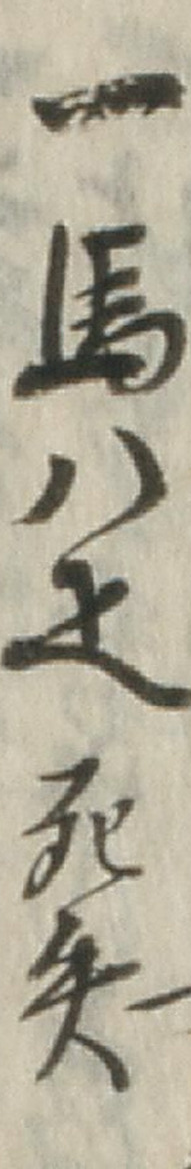一馬八疋死失
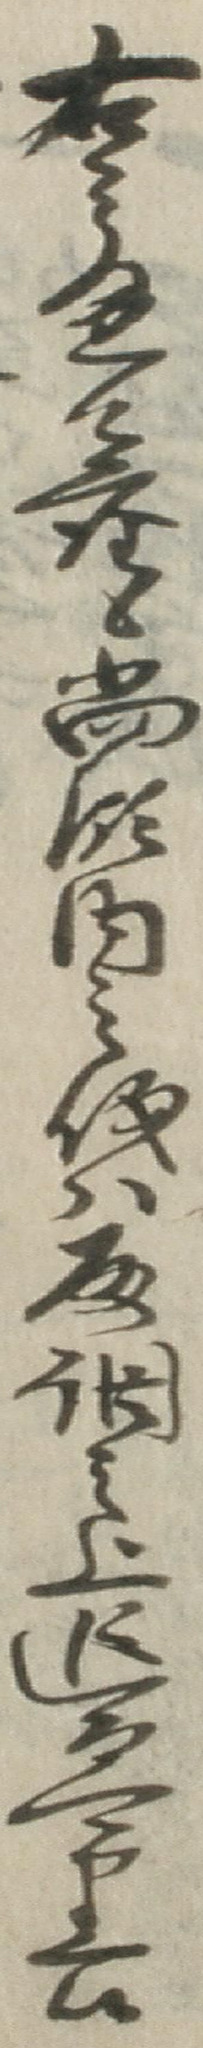右之通御座候尚領内之儀ハ取調之上追而可申上候
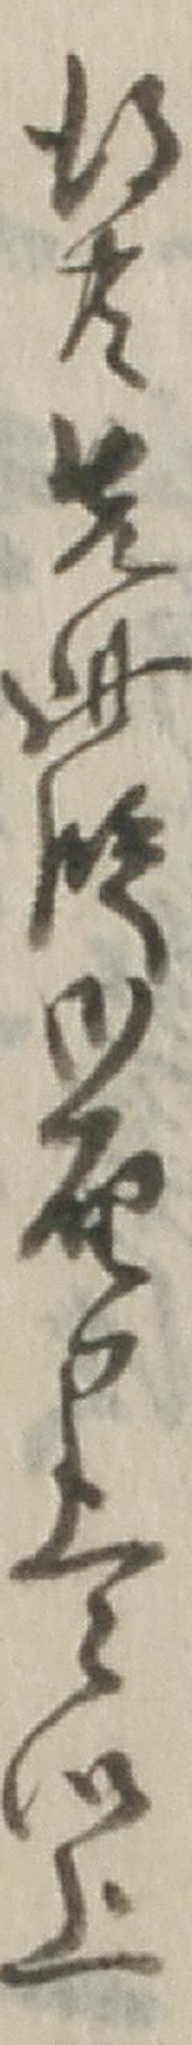得共先此段御届申上候以上
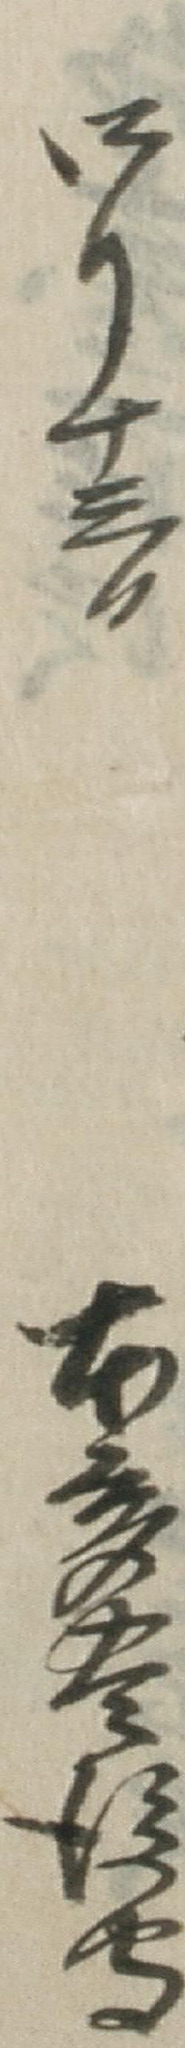四月十三日本多豊後守
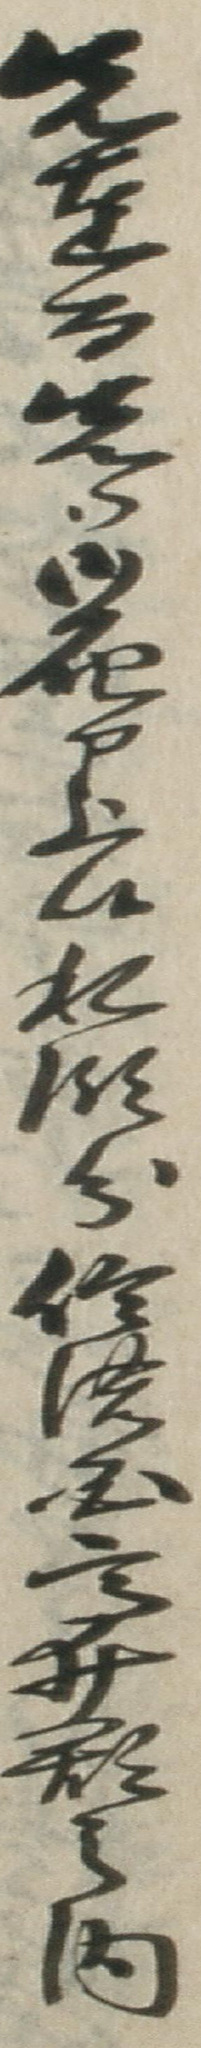先達而先ッ御届申上候私領分信濃国高井郡之内
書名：信濃國地震實録記
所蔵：東京大学地震研究所図書室 Earthquake Research Institute Library, The University of Tokyo, JAPAN
